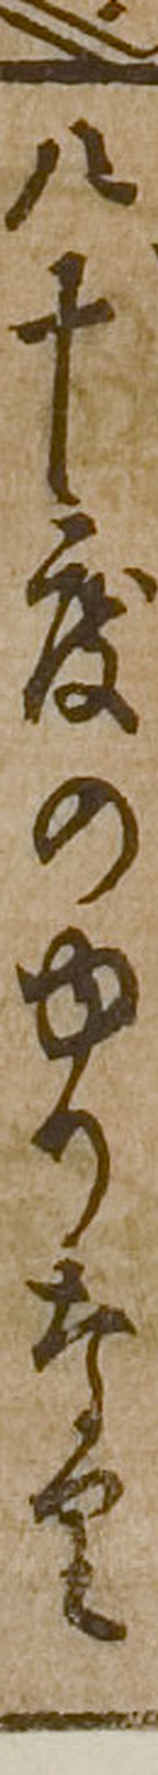八十度のゆりなり
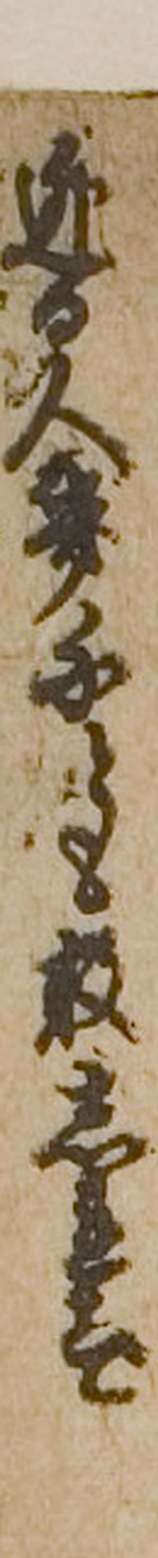逃る人幾千とも数知れす
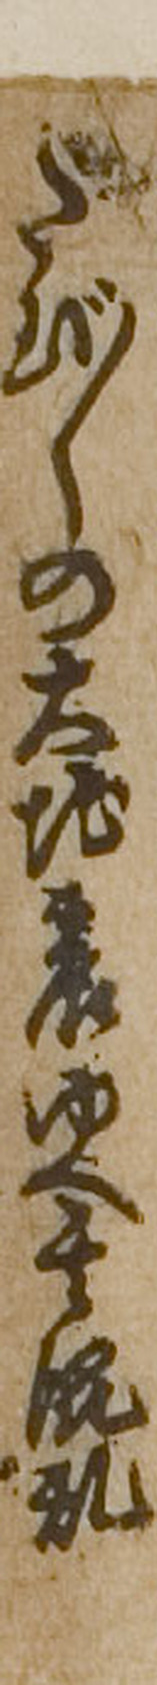たび〳〵の大地震ゆへ其混乱
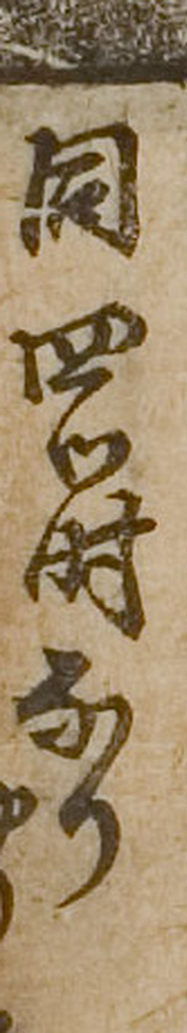同四ツ時なり
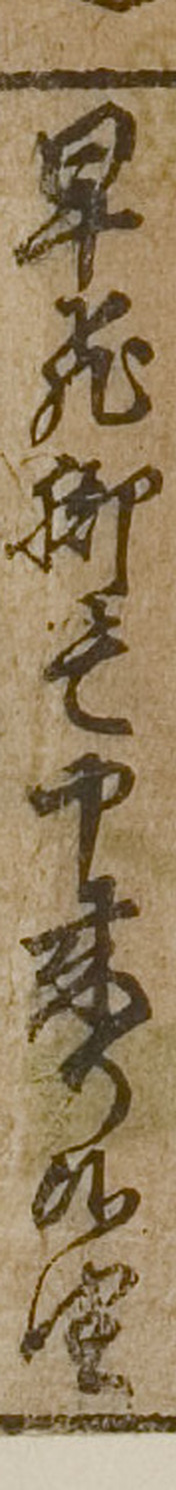早飛脚二て申来り候由
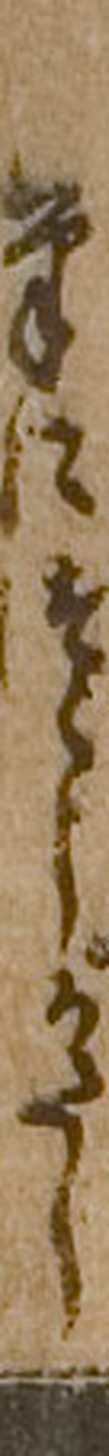筆につくしがたし
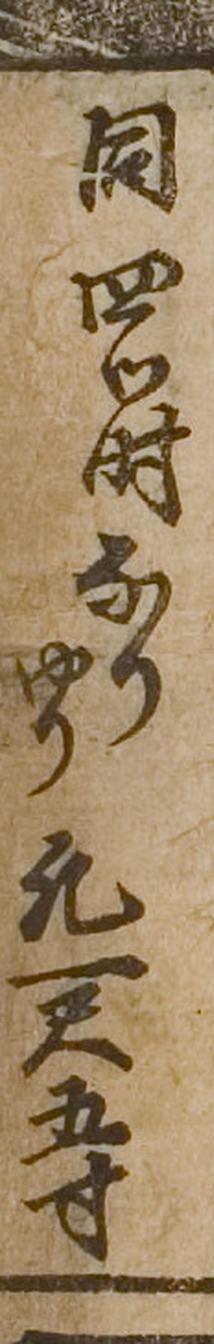同四ツ時なり
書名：[大坂つなみ]
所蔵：東京大学総合図書館 General Library in the University of Tokyo, JAPAN
